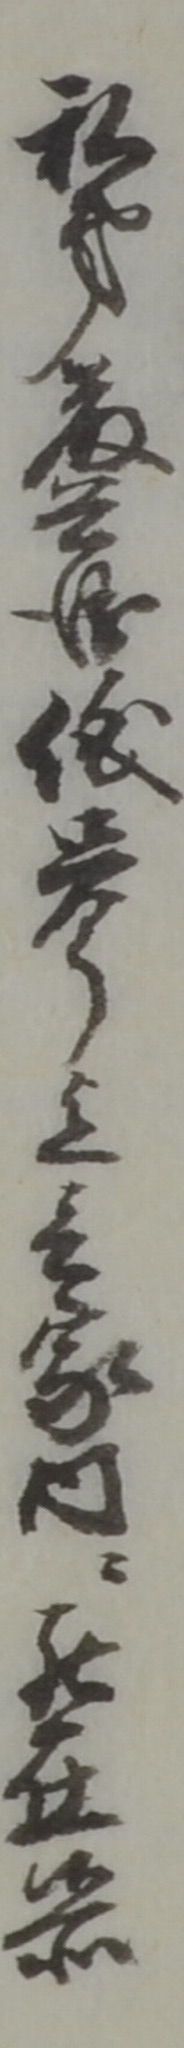私弟藤兵衛儀只今迄壱家内ニ罷在候所
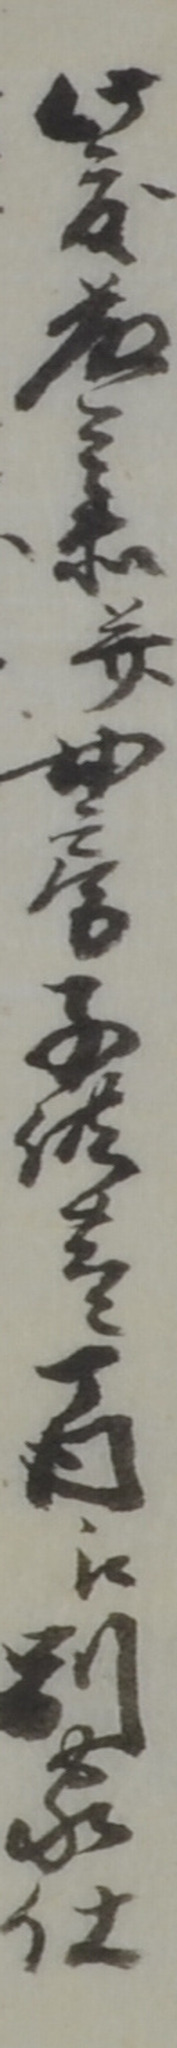此度藤兵衛幷女房子供共ニ丁内江別家仕
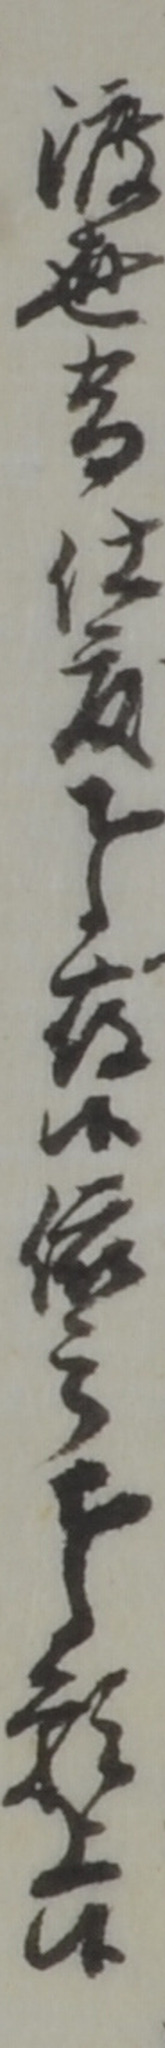渡世為仕度奉存候之奉願上候
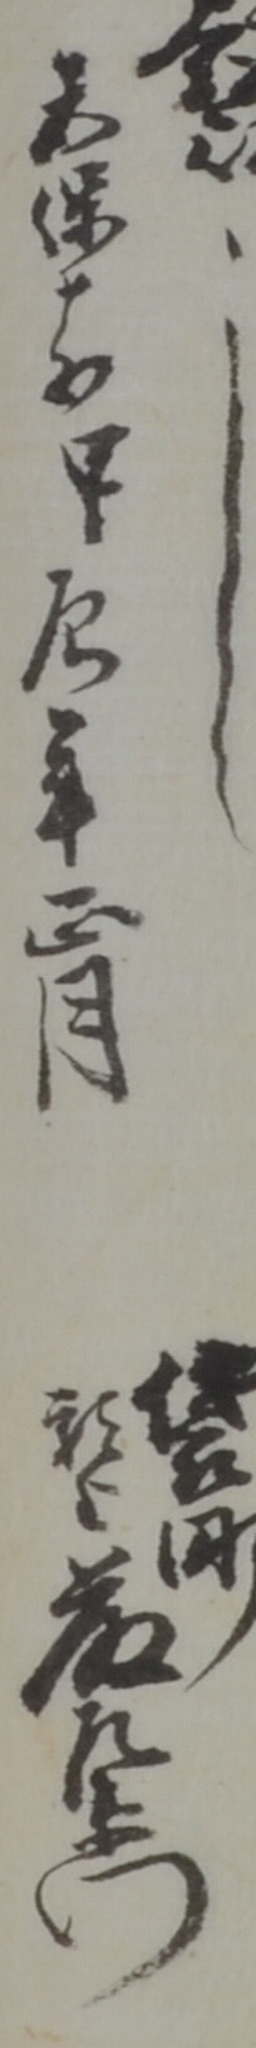天保十五甲辰年正月願主藤左衛門
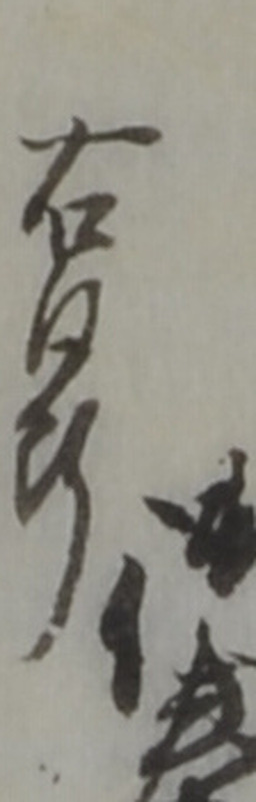右同断
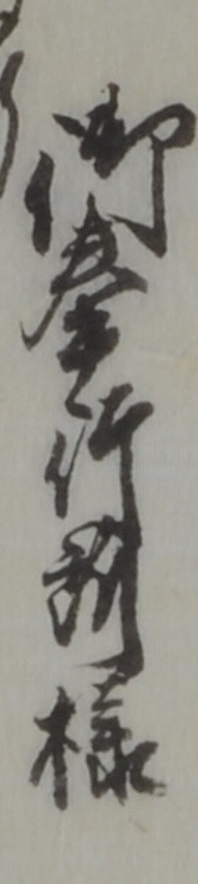御奉行所様
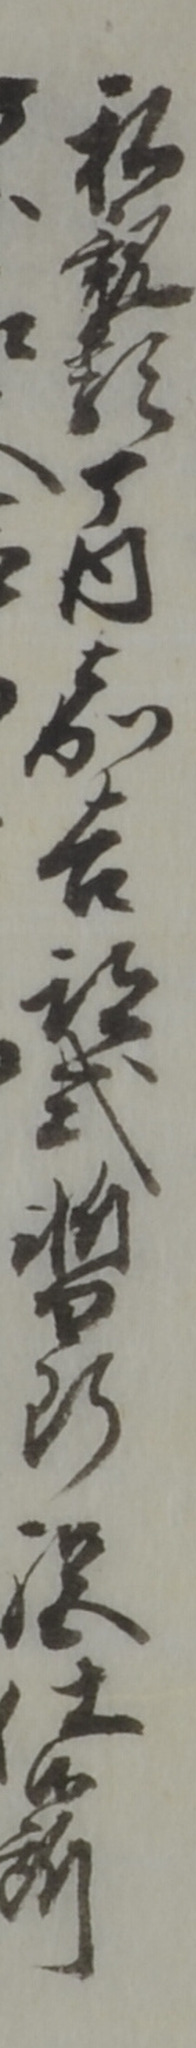私親類丁内嘉吉跡式暫断絶仕候所
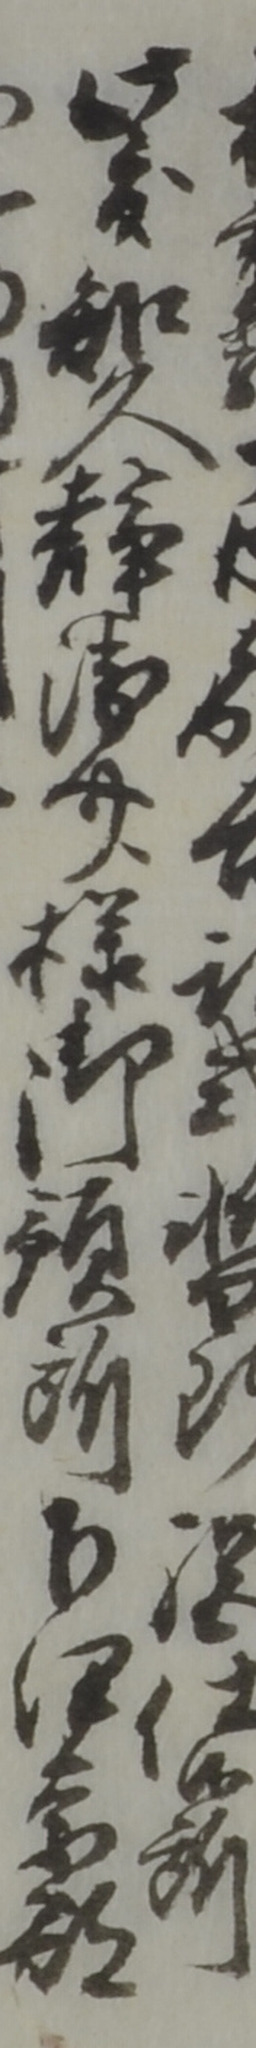此度知久静衛介様御預所下伊奈郡
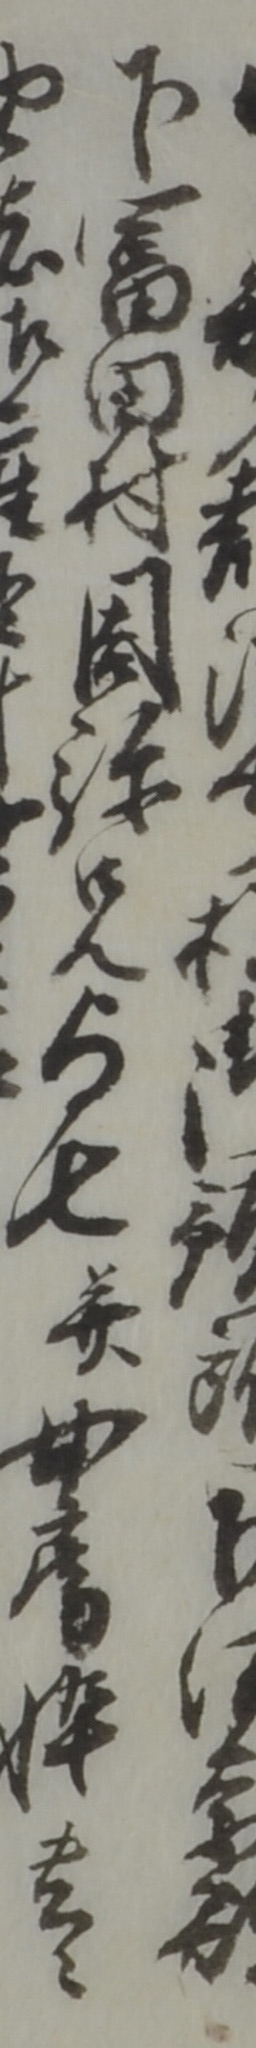下富田村周弥兄与七幷女房忰共ニ
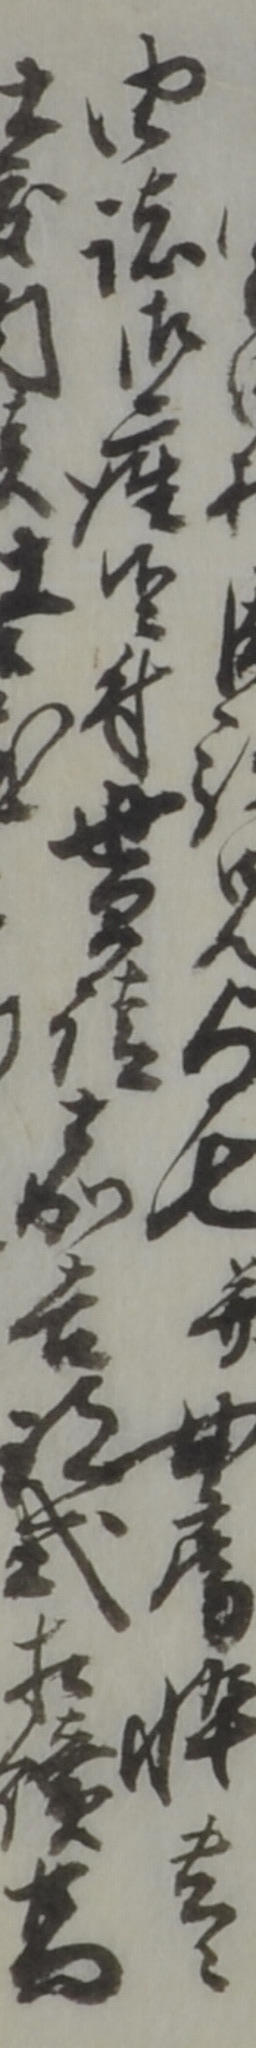由緒御座候ニ付貰請嘉吉跡式相続為
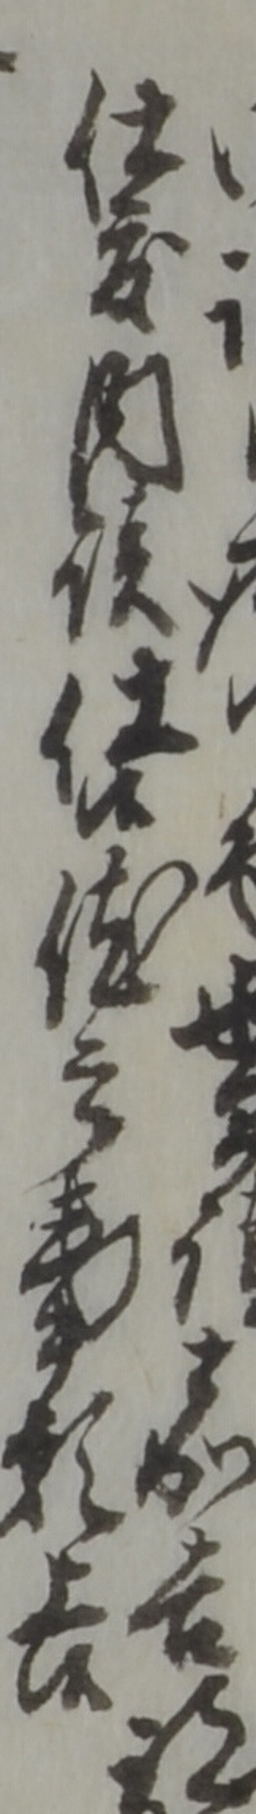仕度内談仕候依之奉願上候
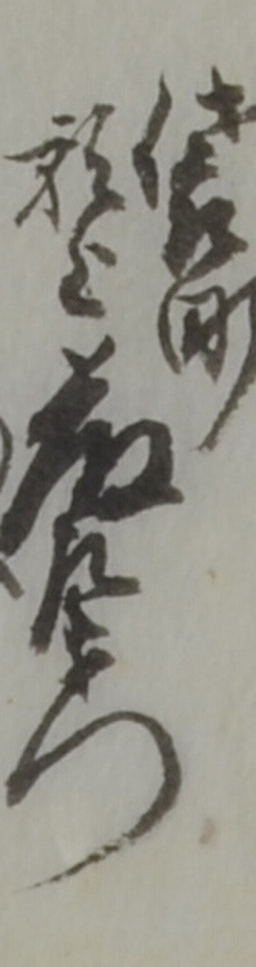願主藤左衛門
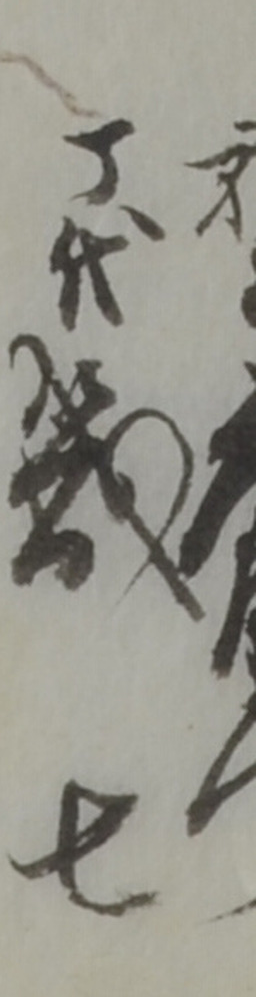丁代幾七
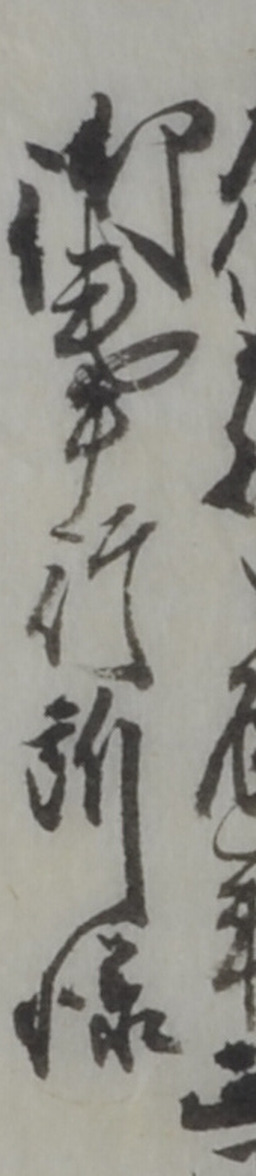御奉行所様
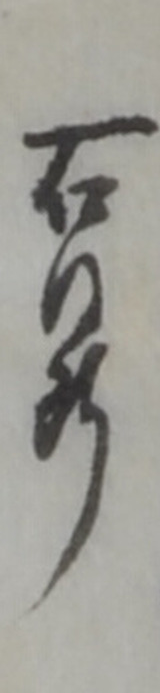右同断

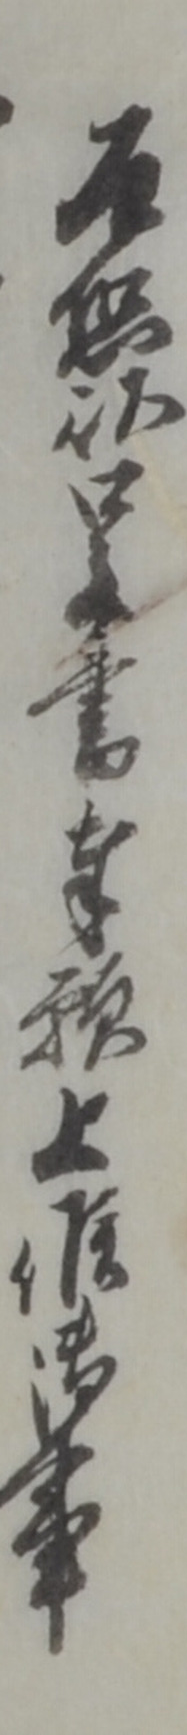乍恐以口上書奉願上候御事
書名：諸願書控簿
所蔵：伊那市立高遠町図書館・合同会社AMANE
